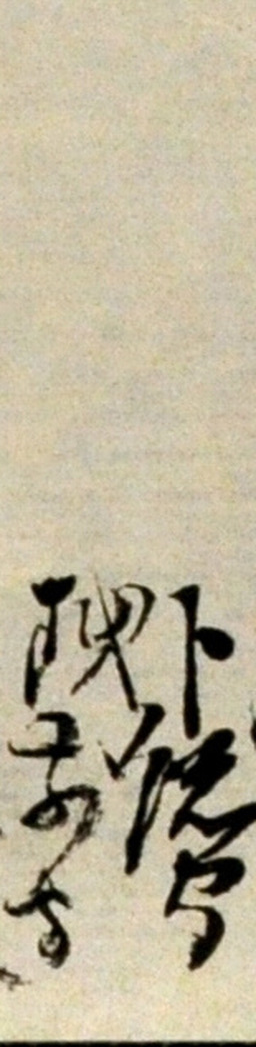越前守
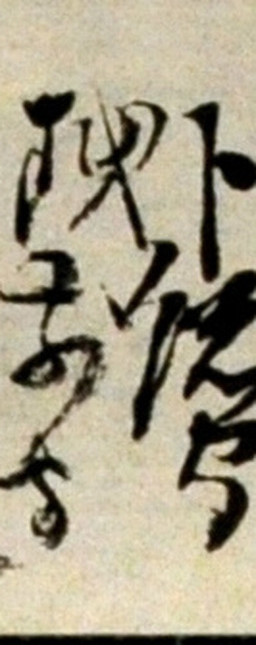越前守
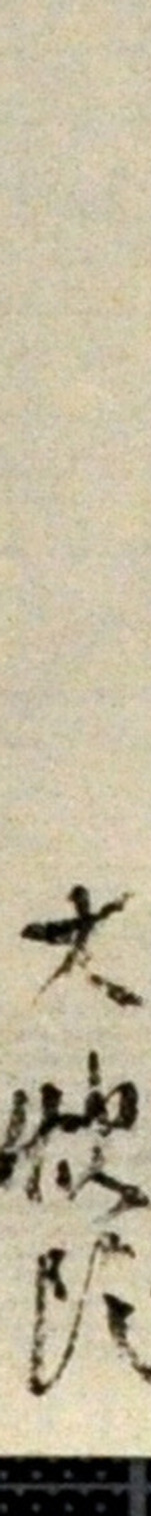大炊頭
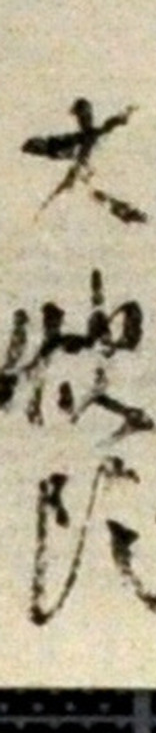大炊頭
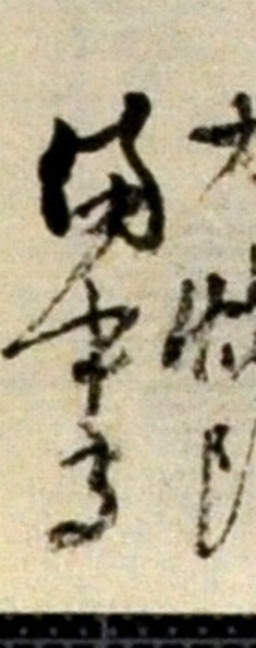備中守
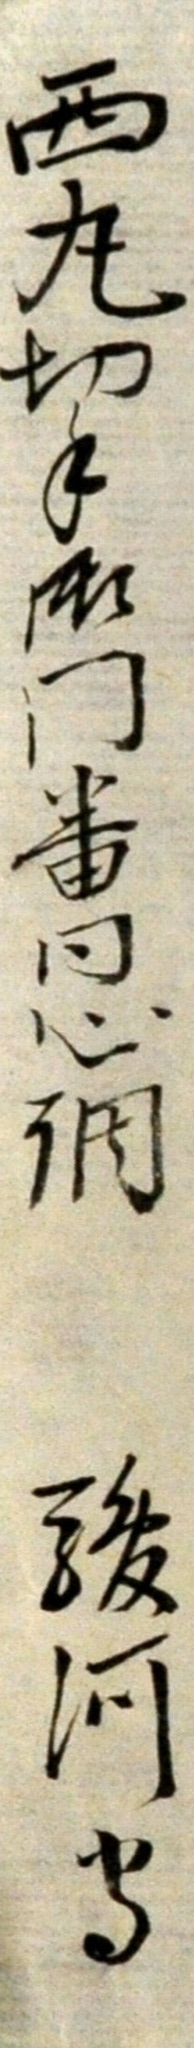西丸切手御門番同心調駿河守

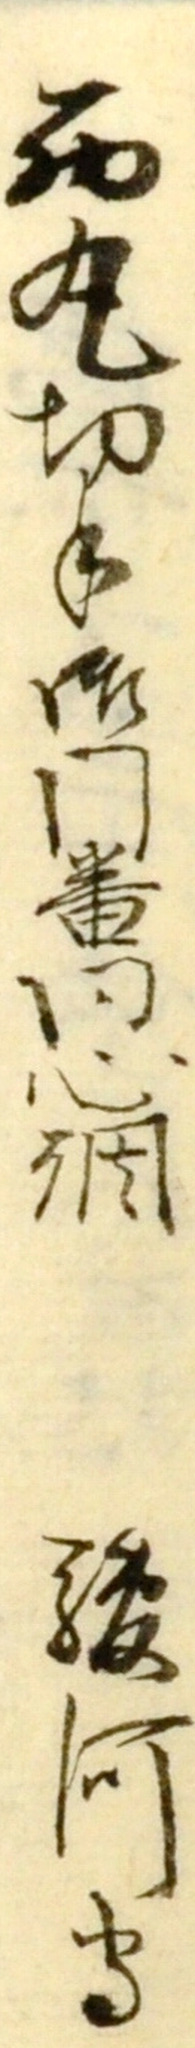西丸切手御門番同心調駿河守

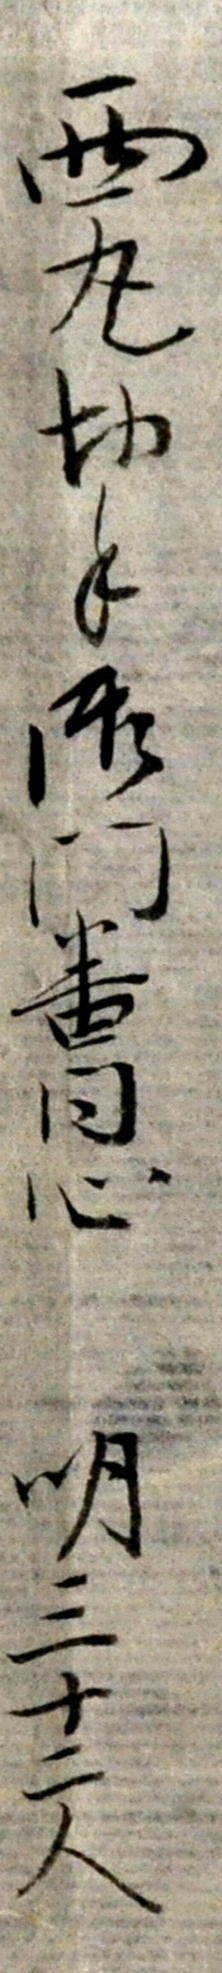西丸切手御門番同心明三十二人
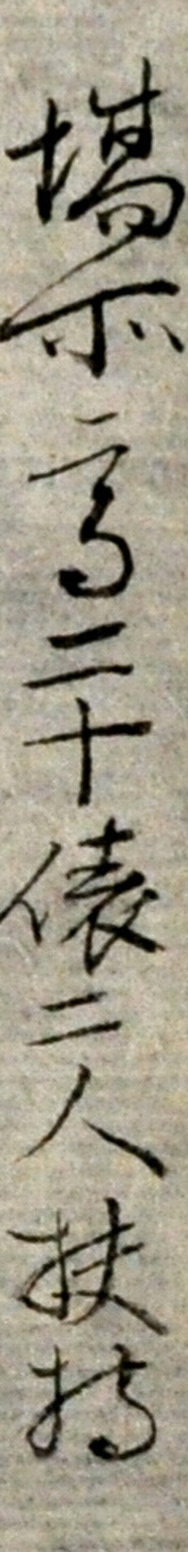場所高二十俵二人扶持
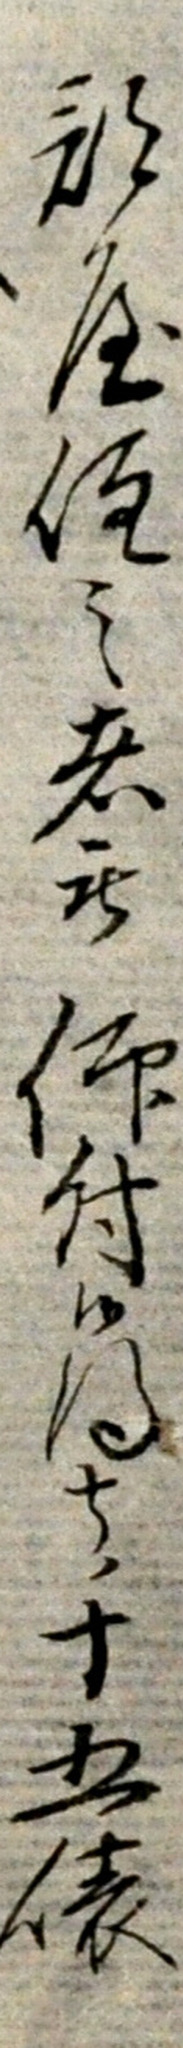部屋住之者被仰付候得者十五俵
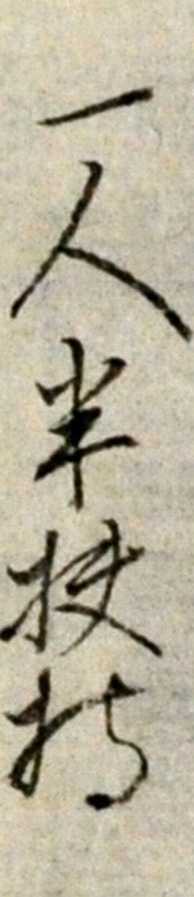一人半扶持
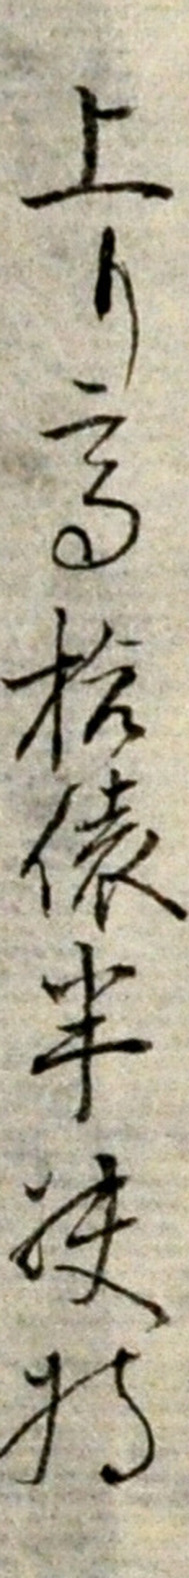上リ高拾俵半扶持
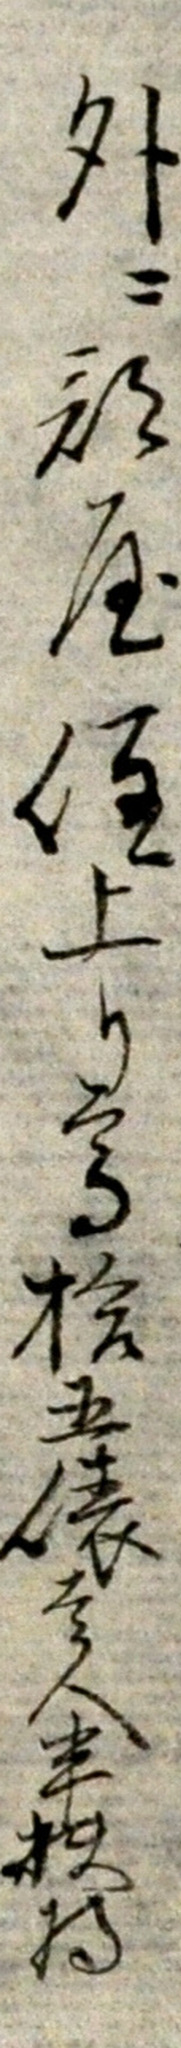外ニ部屋住上リ高十五俵一人半扶持
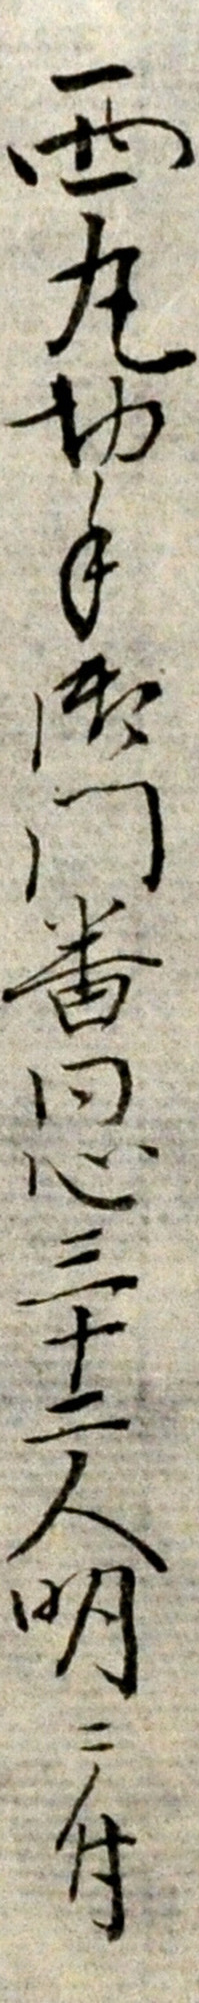西丸切手御門番同心三十二人明ニ付
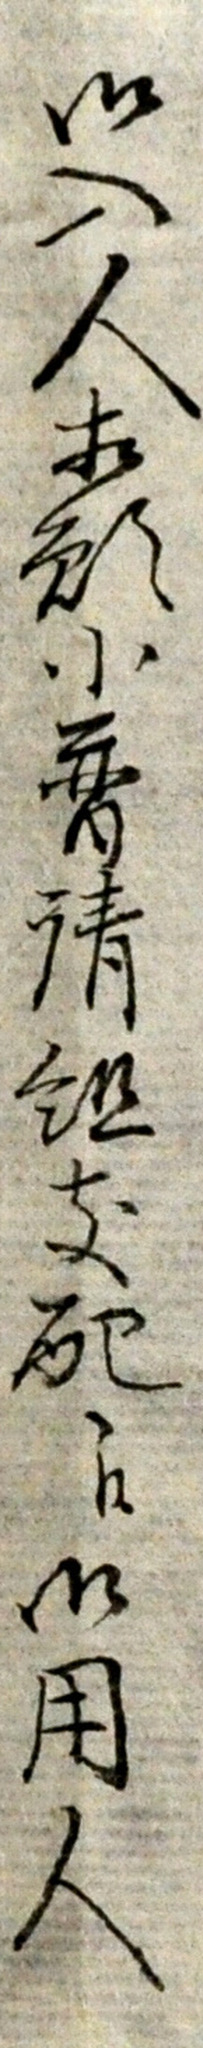御入人相願小普請組支配江御用人
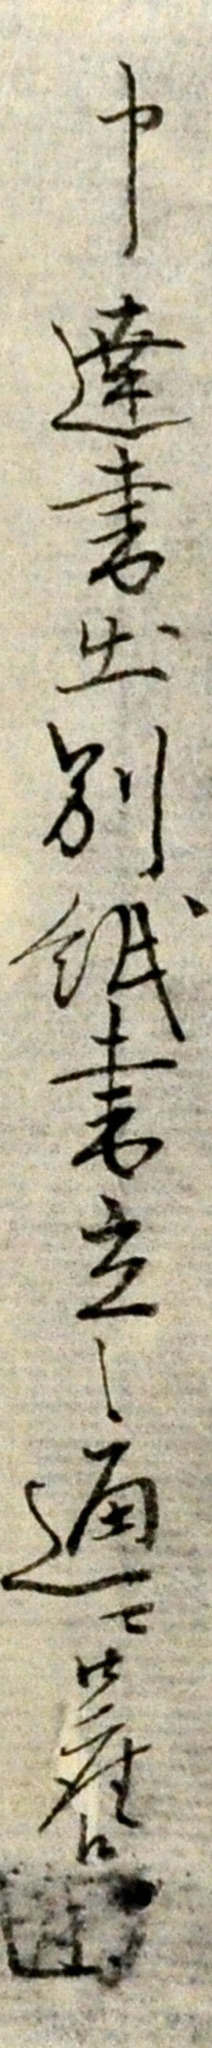申達書出別紙書立之通ニ御座候
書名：若年寄御役中御調書付
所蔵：伊那市立高遠町図書館・合同会社AMANE
